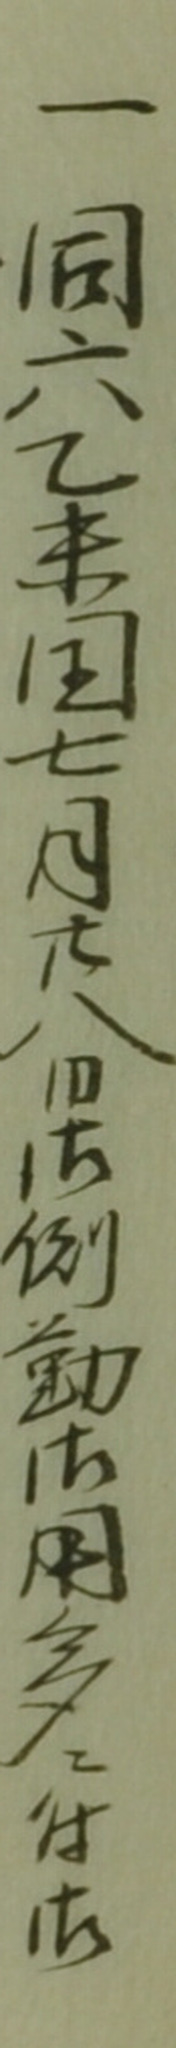一同六乙未閏七月廿八日御側勤御用多付御
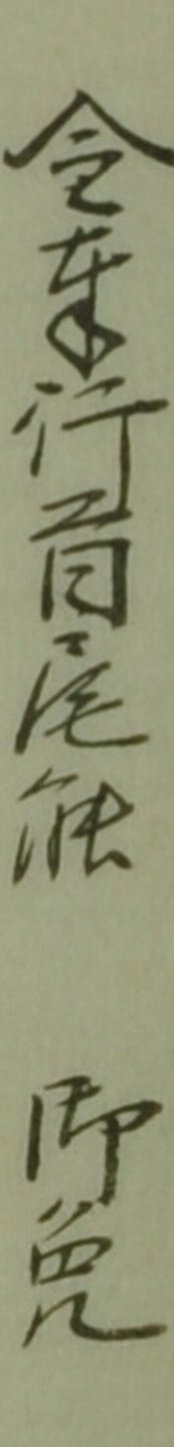金奉行首尾能御免
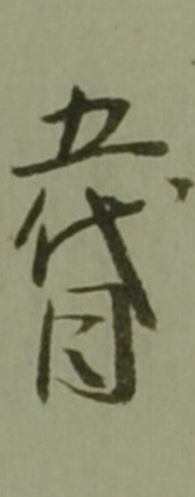五代目
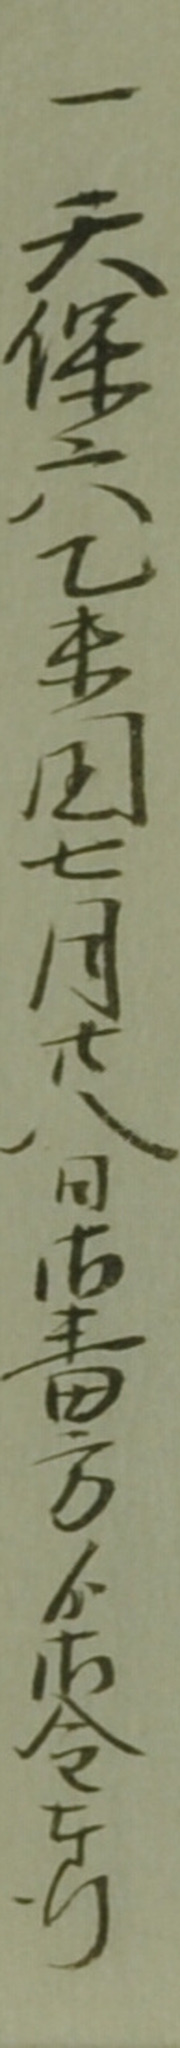一天保六乙未閏七月廿八日御番方ゟ御金奉行
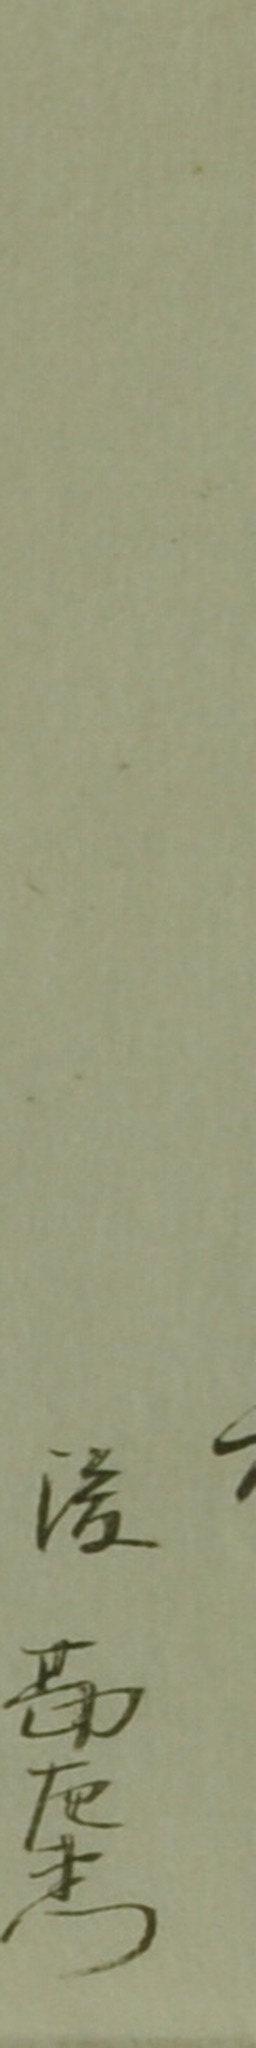後甚左衛門
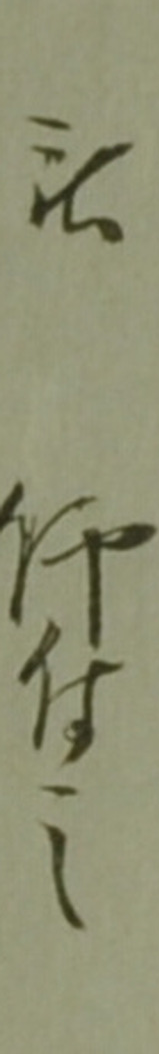被仰付之
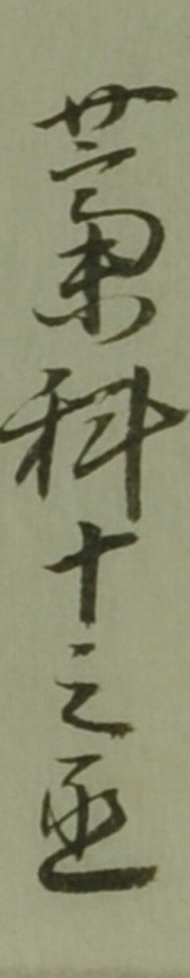藁科十之丞
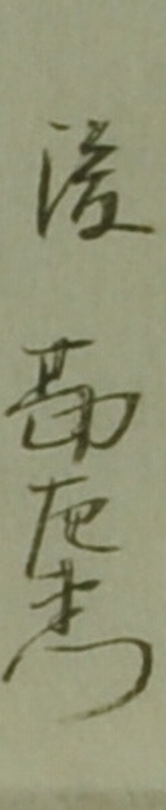後甚左衛門
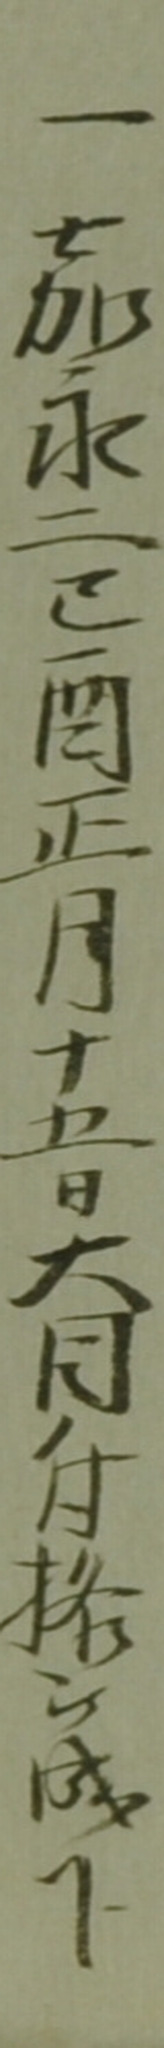一嘉永二己酉正月十五日大目付格被成下
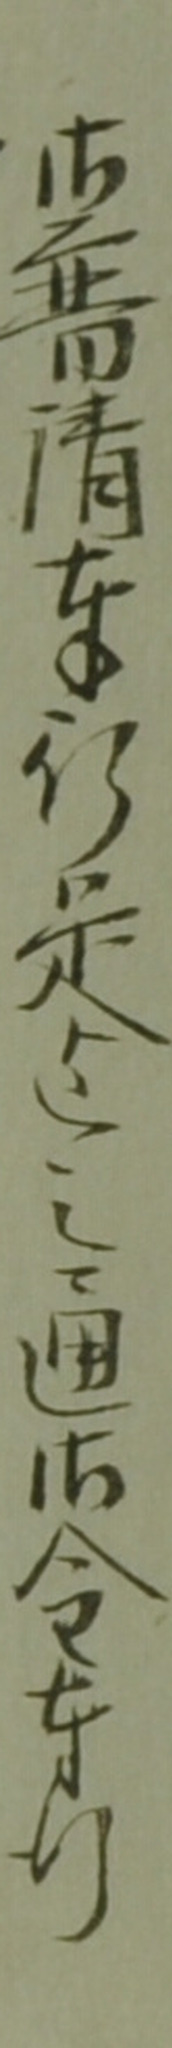御普請奉行是迄之通御金奉行

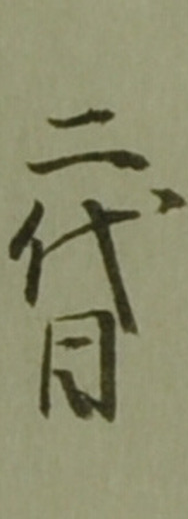二代目
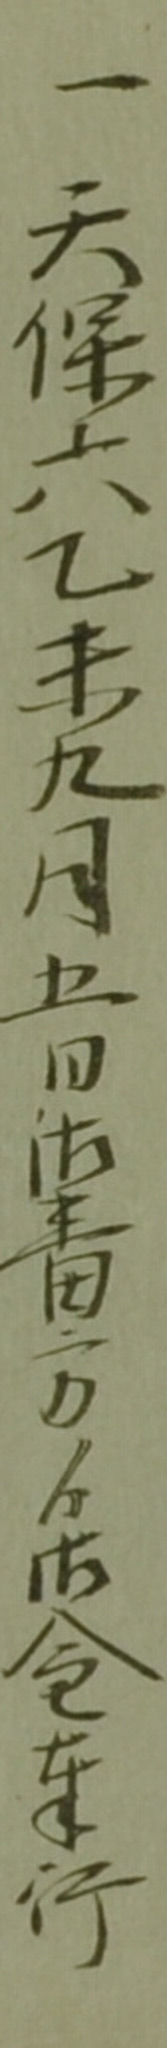一天保六乙未九月五日御番方ゟ御金奉行
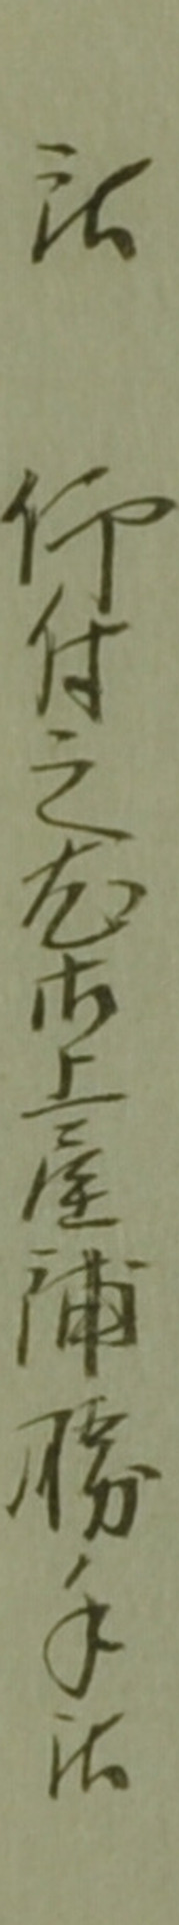被仰付之尤御上屋舗勝手被
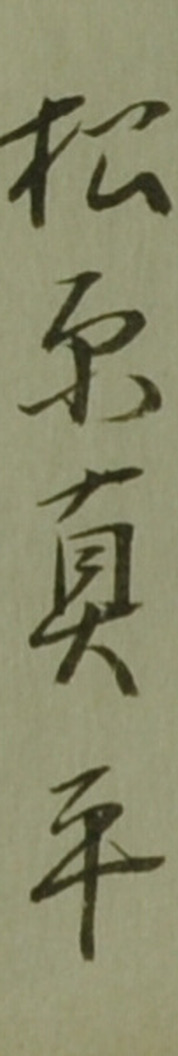松原真平
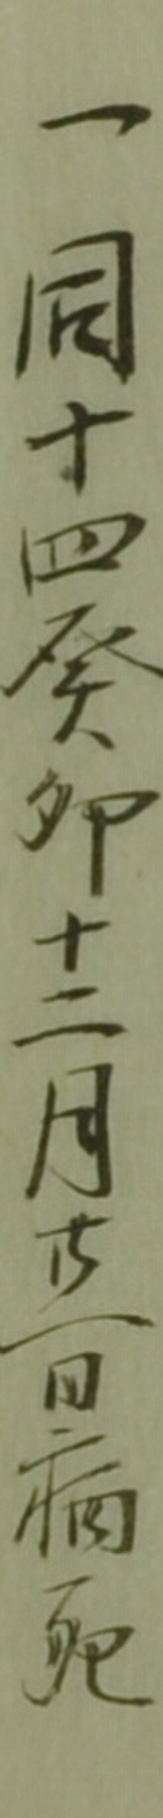一同十四癸卯十二月廿一日病死
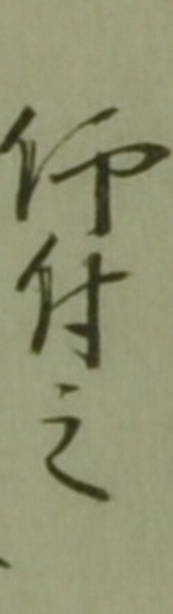仰付之
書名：諸御役代々録（七）
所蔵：伊那市立高遠町図書館・合同会社AMANE
